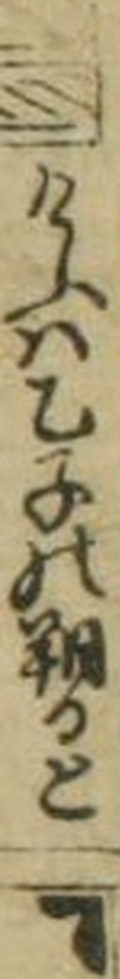けふは乙子の朔日と
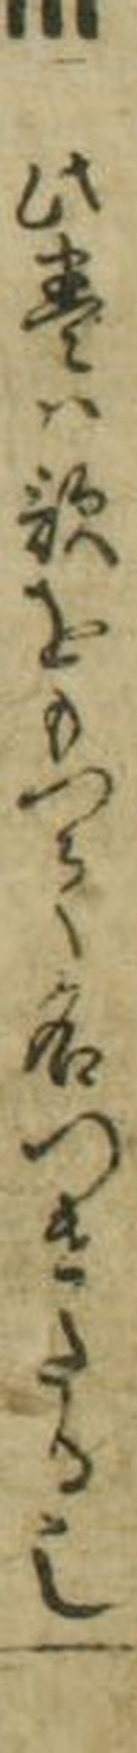此巻は歌をもつて名つけたる也
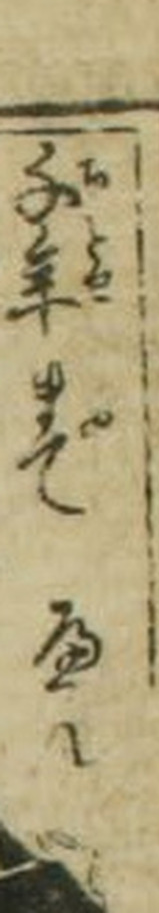千年までへし
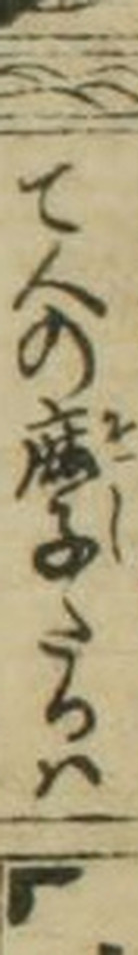て人の庶子たるは
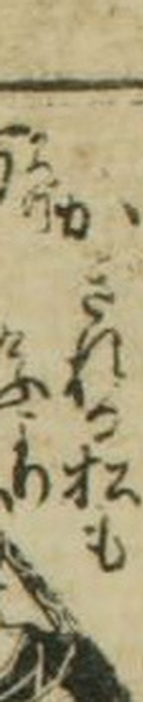かぎれる松も
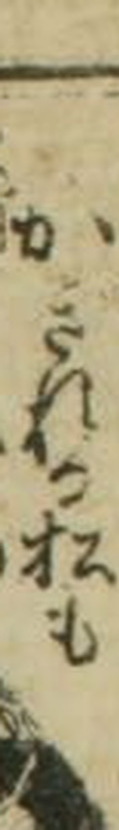かぎれる松も
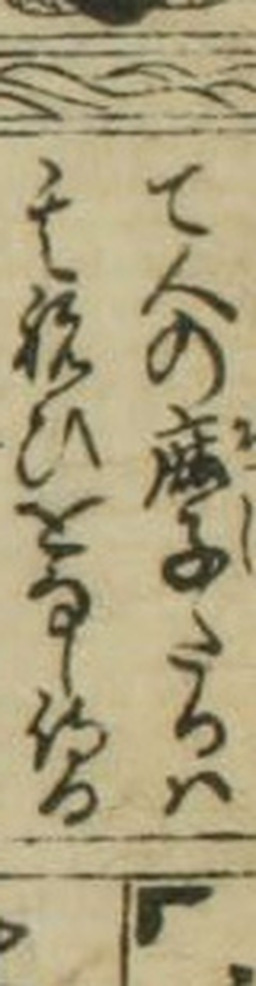其祝をなし侍る
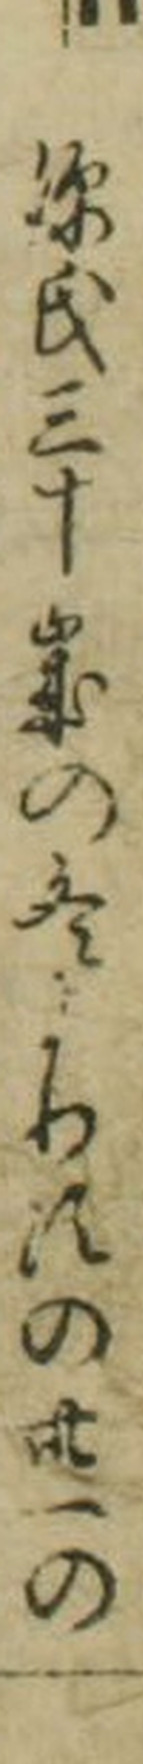源氏三十歳の冬より次の丗一の
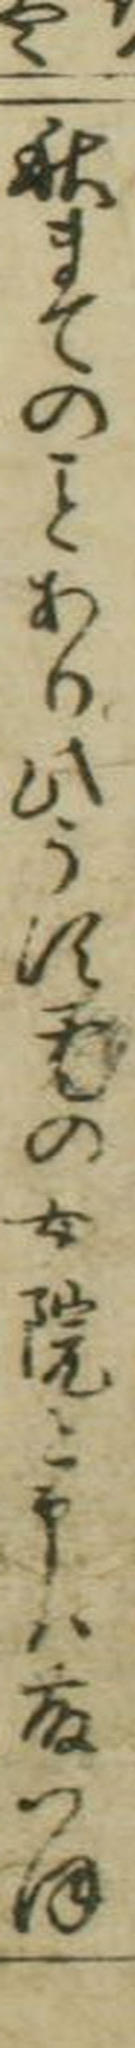秋まてのことあり。此うす雲の女院と申は藤つほ
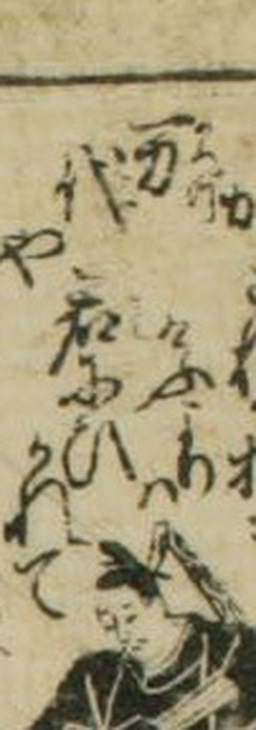やかれて
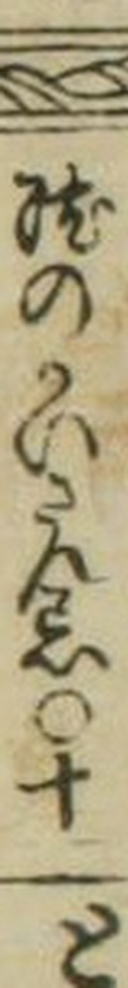院のかいさん忌○十
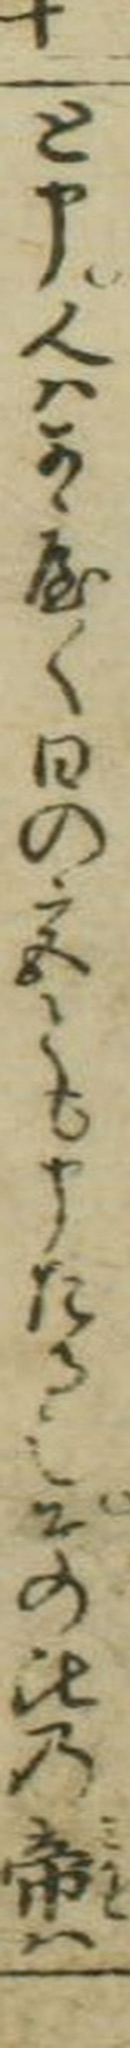と申し。人はかゝやく日の宮とも申したる也。その比の帝は
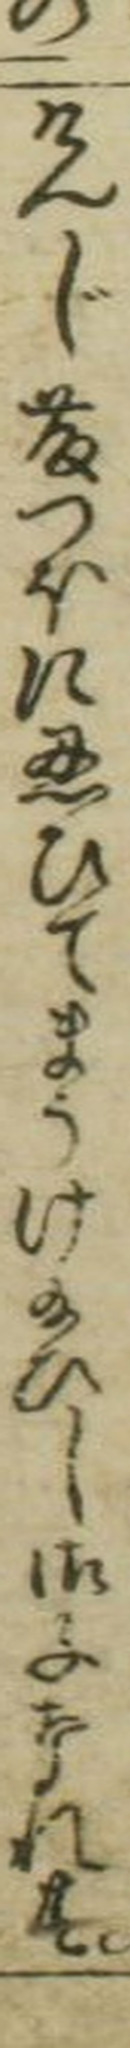けんじ藤つほに忍ひてまうけ給ひし御子なれ共。
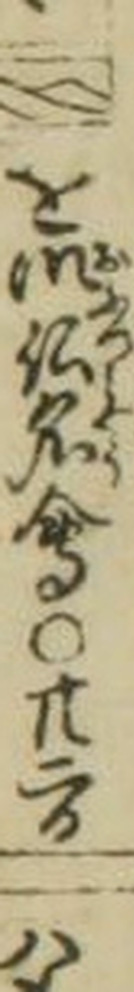を御仏名会○廿二日
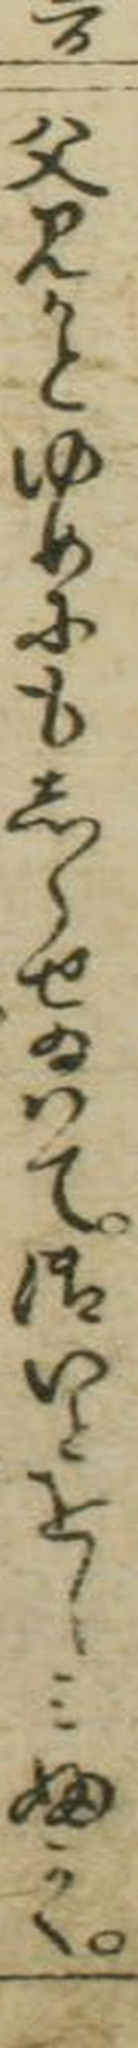父みかとゆめにもしらせ給はて。御いとをしみふかく。
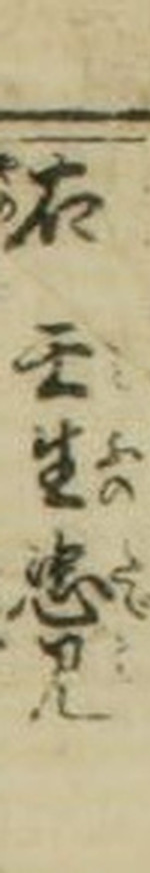右壬生忠見
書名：女源氏教訓鑑
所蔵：東京学芸大学附属図書館
